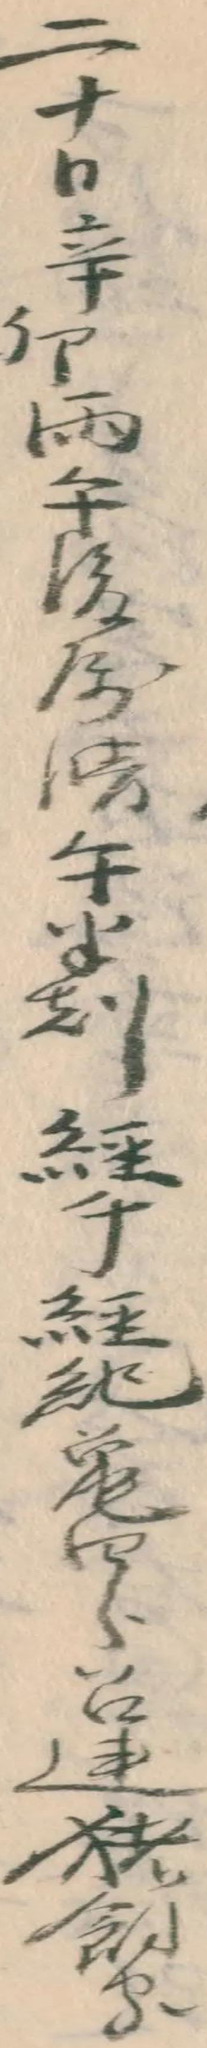二十日辛卯雨午後属情午半刻経千経紀亀四郎召連猪飼家
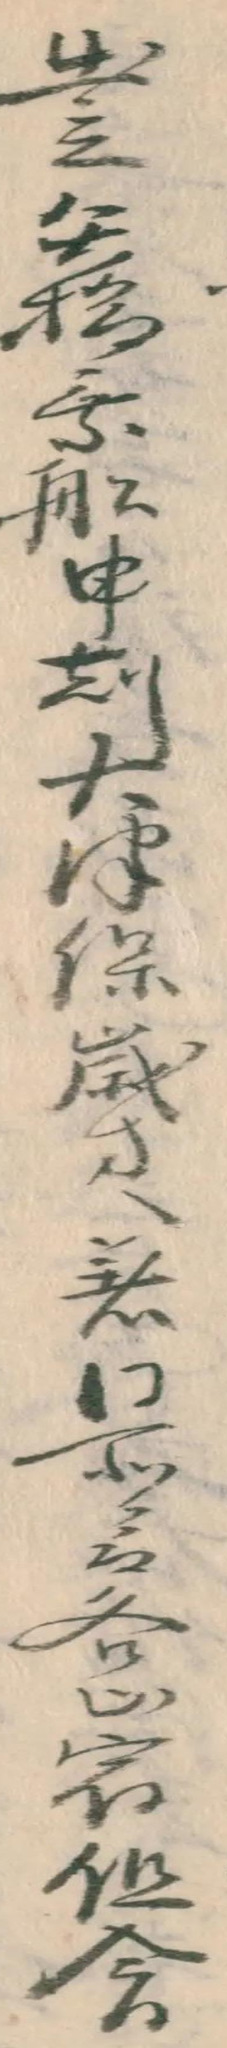出立矢橋乗船申刻大津保歳方へ著同所ニ而各止宿但今日
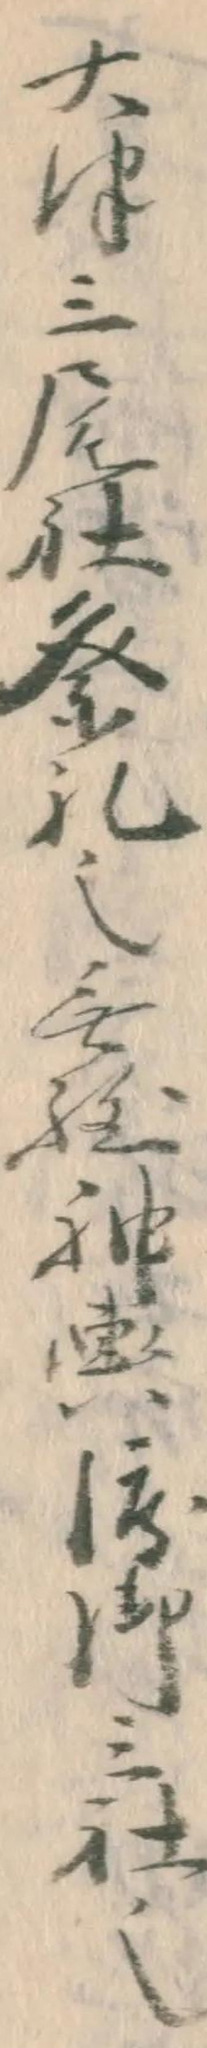大津三尾社祭礼也無程神輿渡御三社也
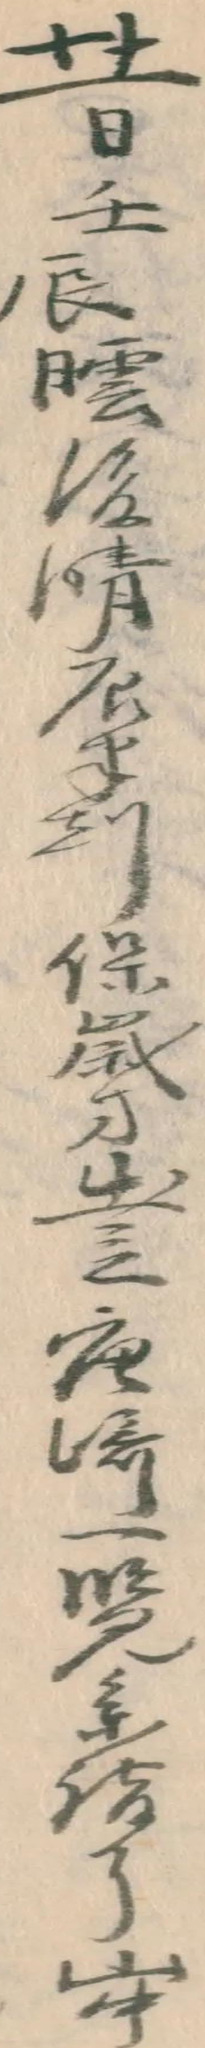廿一日壬辰曇後辰半刻保歳方出立唐崎一覧参詣了山中
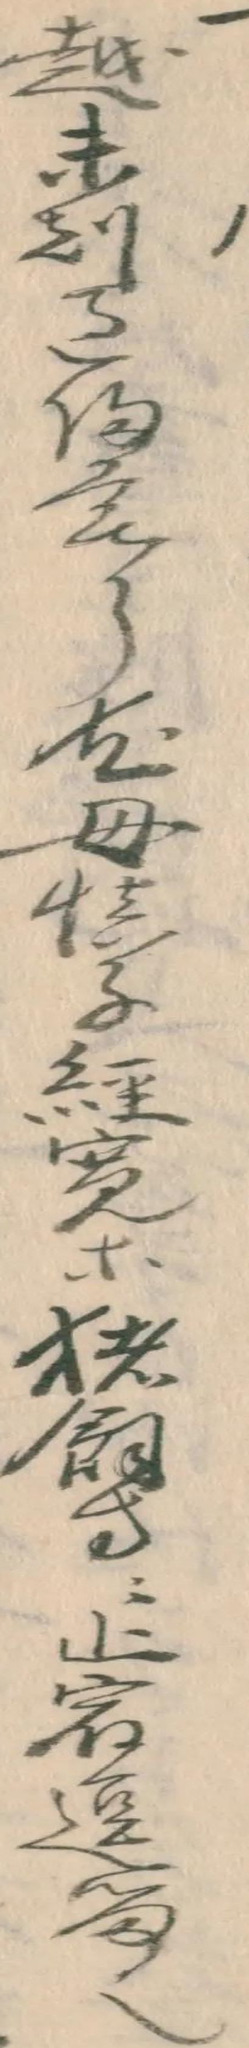越未刻過帰宅了尤母慎子経寛等猪飼方ニ止宿逗留也
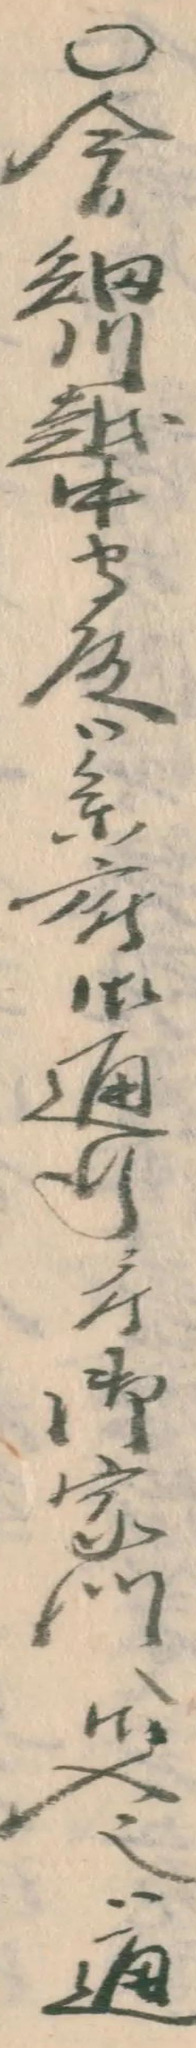○今日細川越中守殿御参府御通行ニ付御家門へ御入也御通
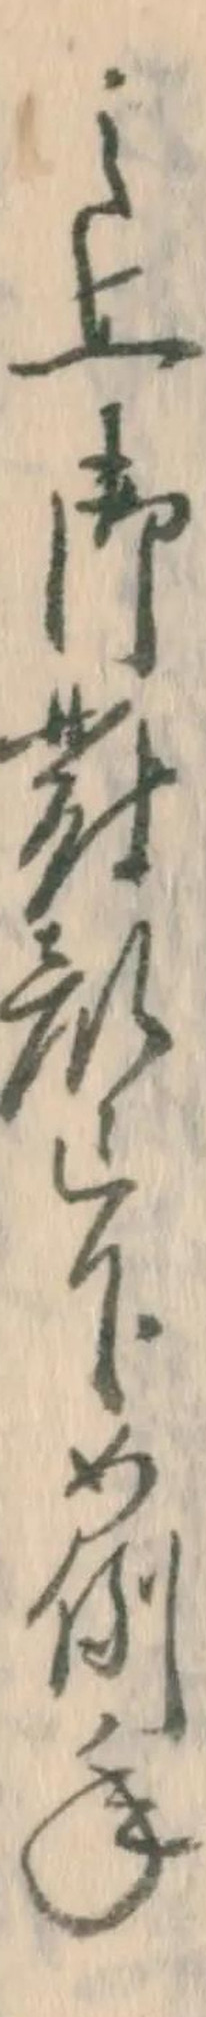之上御對顔被下如例年
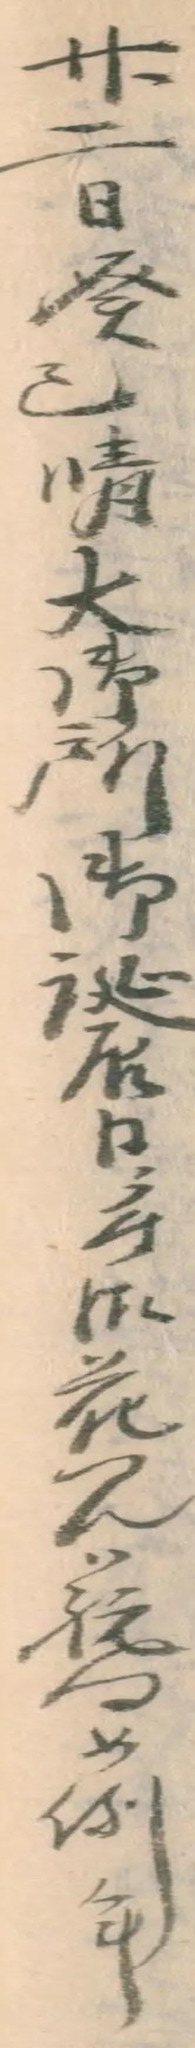廿二日癸巳晴大御所御誕辰日ニ付御花見御祝向如例年
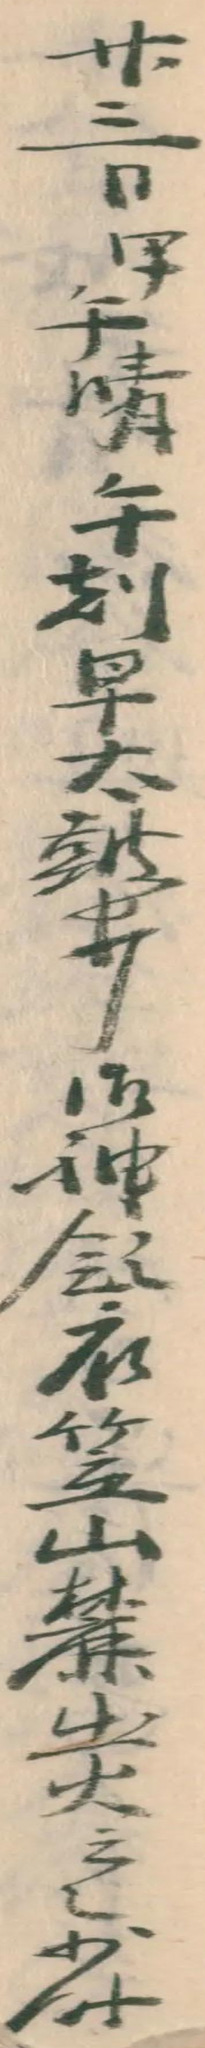廿三日甲午晴午刻早太鼓打御神領衣笠山麓出火云々少時
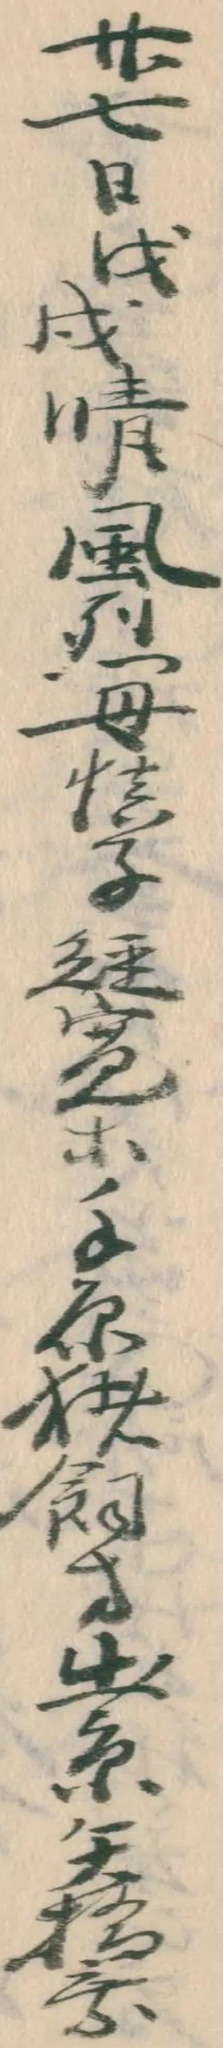廿七日戊戌曇風烈母慎子経寛等手原猪飼方出京矢橋乗
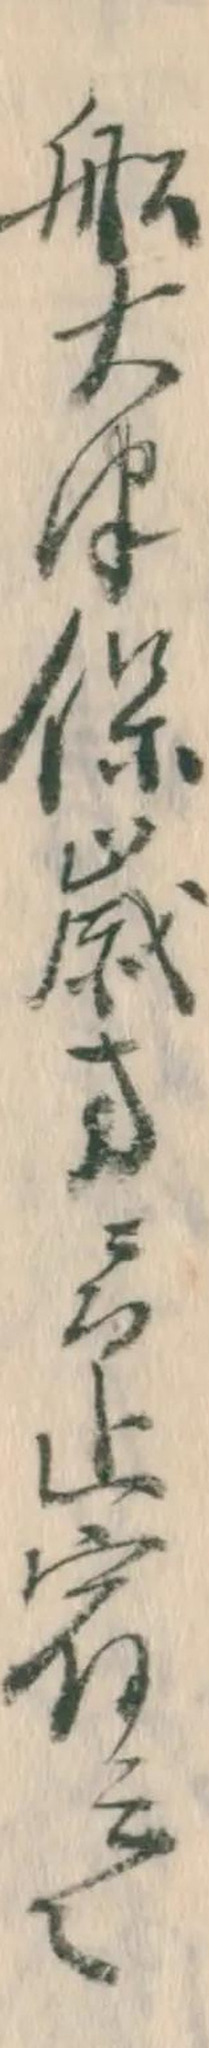船大津保歳方ニ而止宿云々
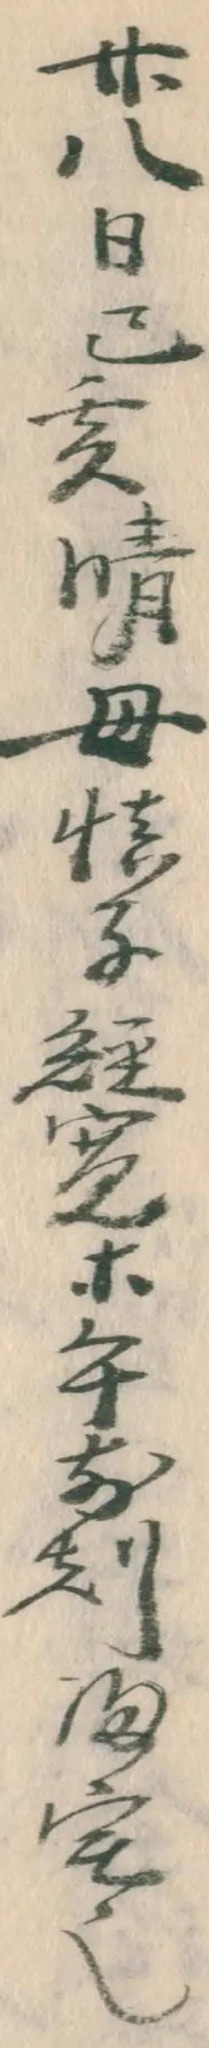廿八日己亥晴母慎子経寛等午前刻帰宅也
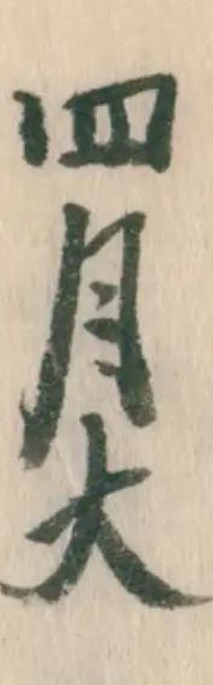四月大
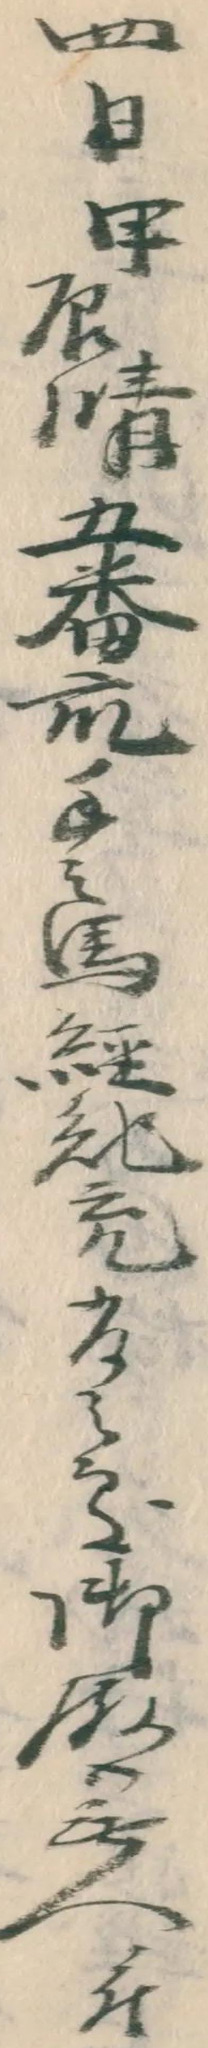四日甲辰晴五番衆手之馬経紀充有之處御殿御無人に付
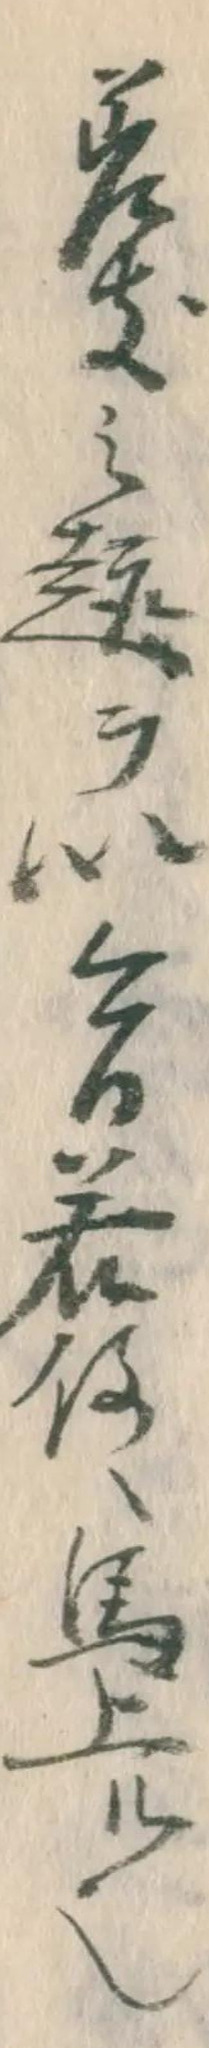差支之趣ヲ以今日若役へ馬上ル也
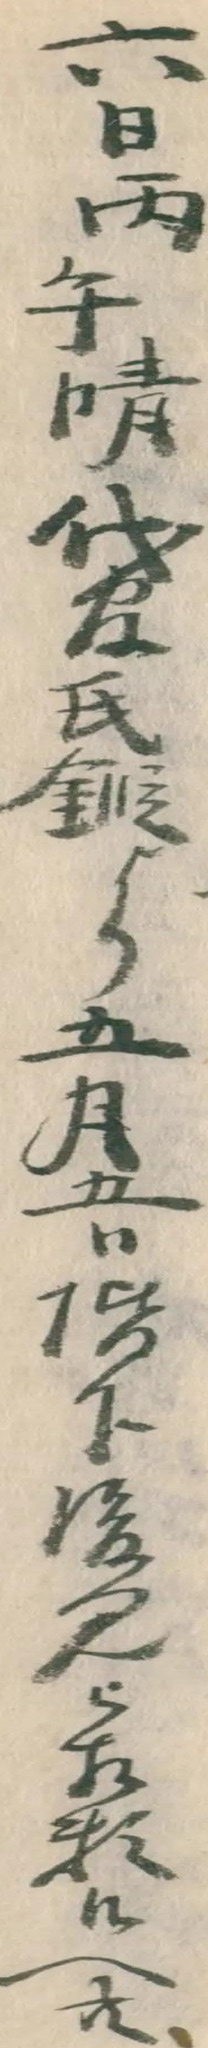六日丙午晴代官氏鐵より五月五日階下後見被相頼候へ共
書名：賀茂社記録. 第66冊
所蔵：国立国会図書館 National Diet Library, JAPAN
